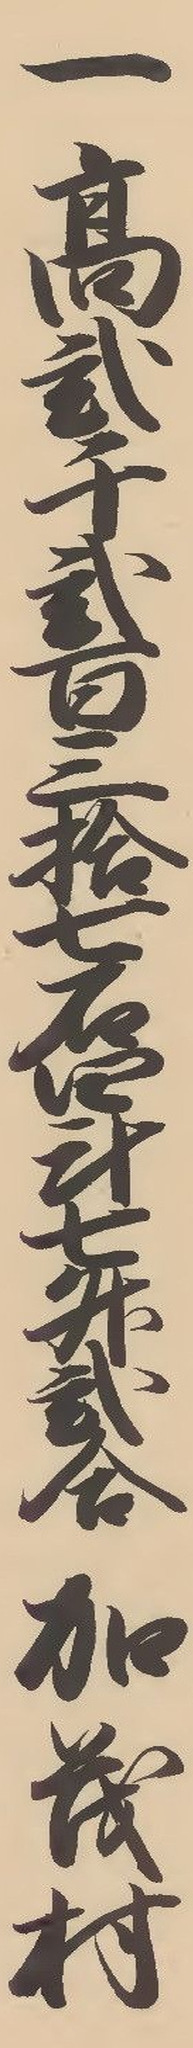一高弐千弐百三拾七石四斗七升弐合加茂村

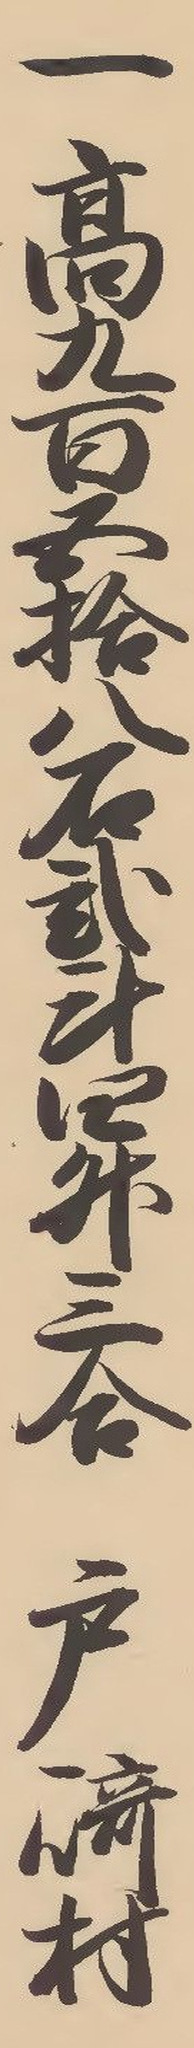一高九百五拾八石弐斗四升三合戸崎村
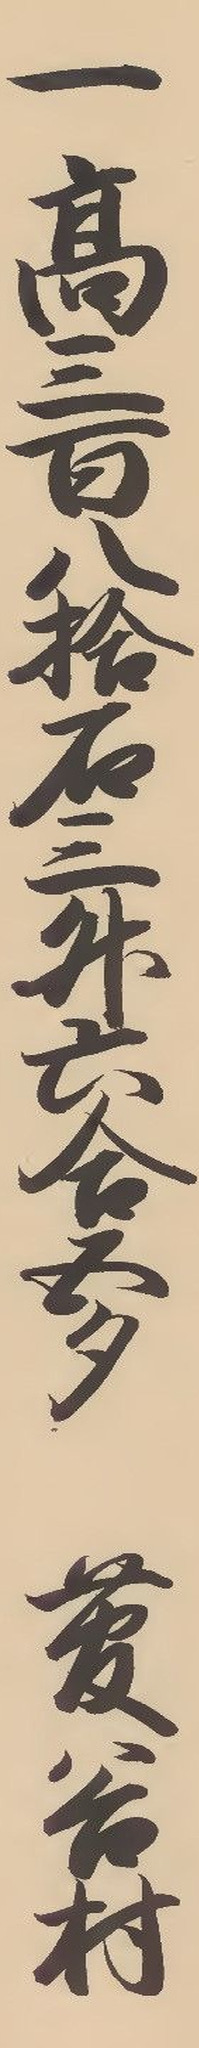一高三百八拾石三升六合五勺菅谷村
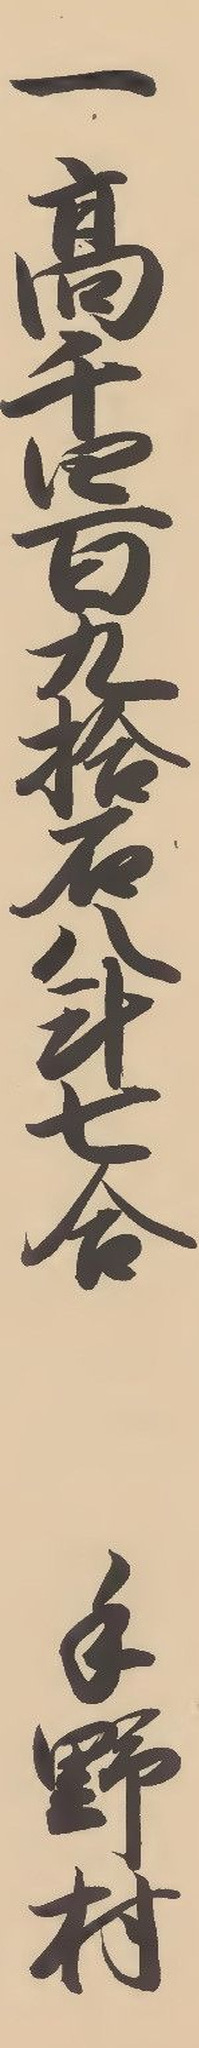一高千四百九拾石八斗七合手野村
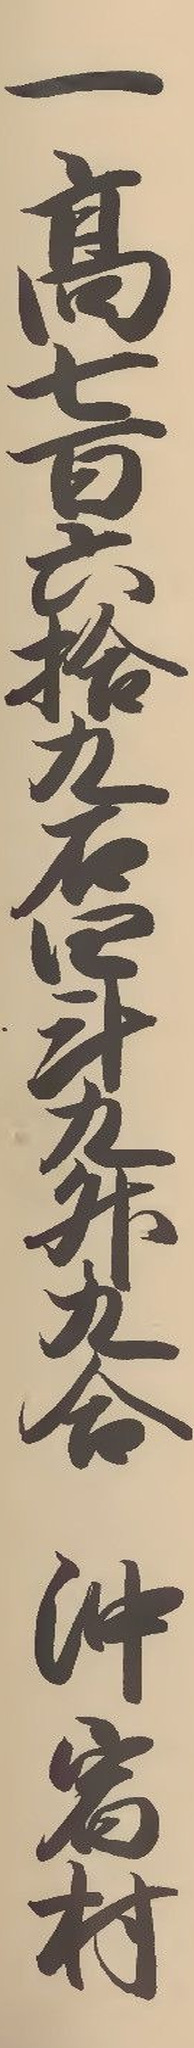一高七百六拾九石四斗九升九合沖宿村
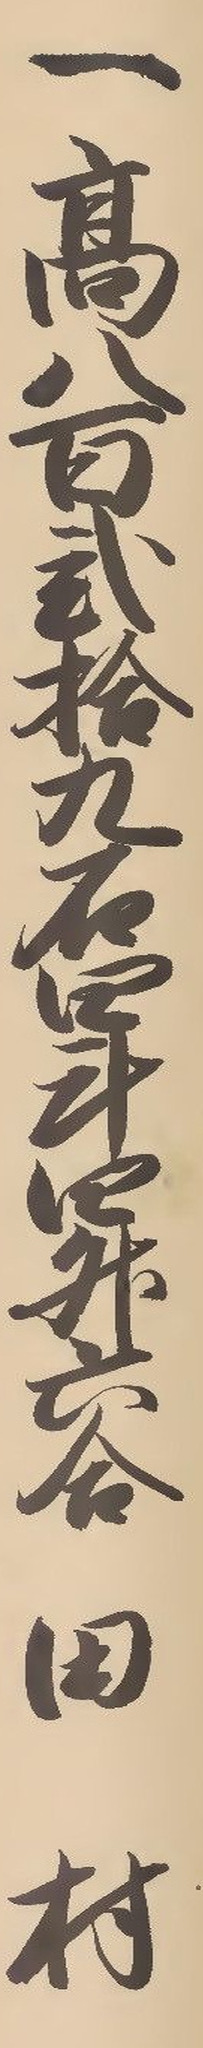一高八百弐拾九石四斗四升六合田村
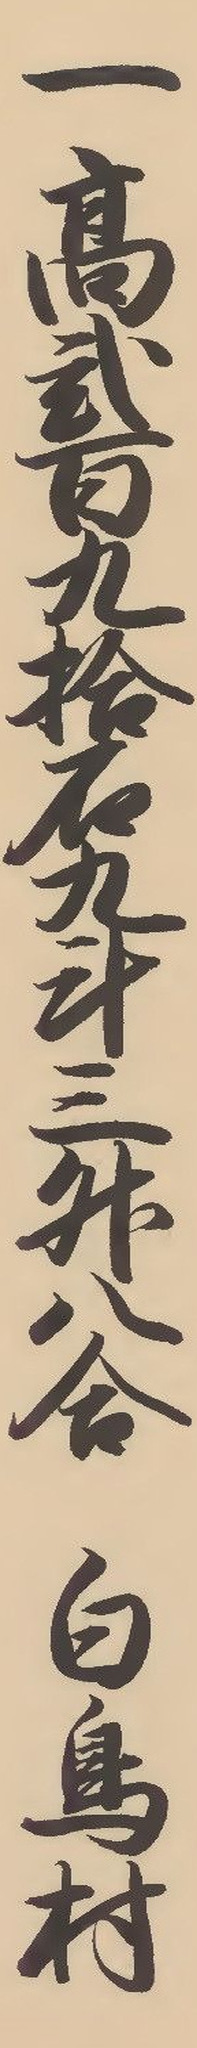一高弐百九拾石九斗三升八合白鳥村
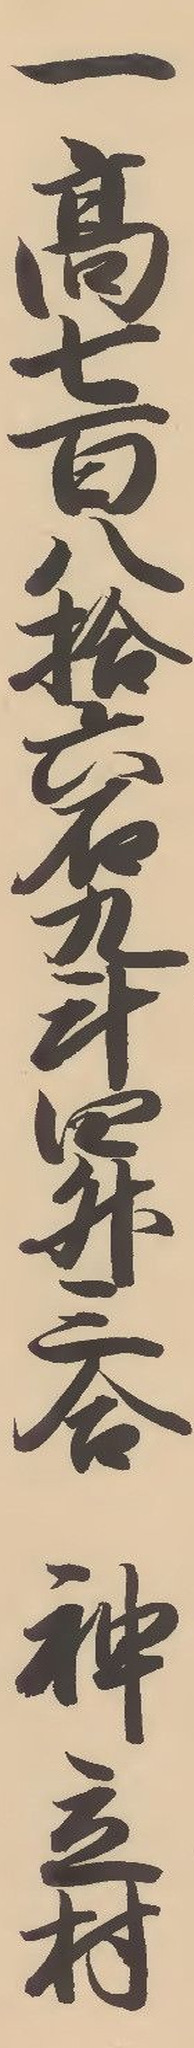一高七百八拾六石九斗四升三合神立村
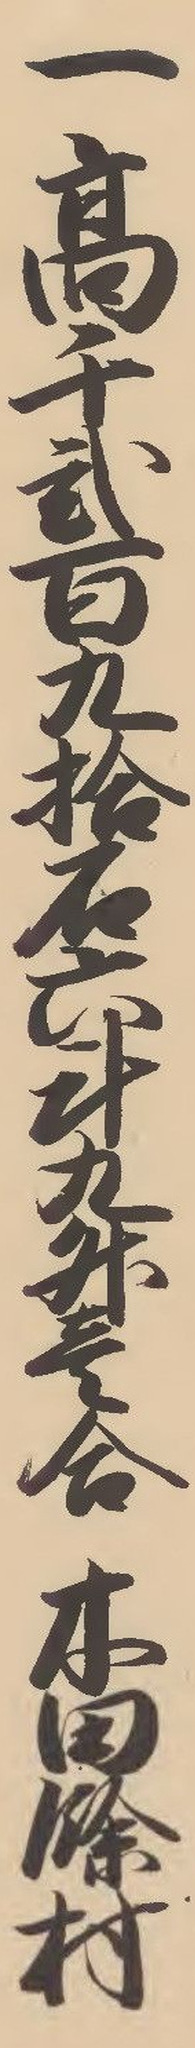一高千弐百九拾石六斗九升壱合木田余村

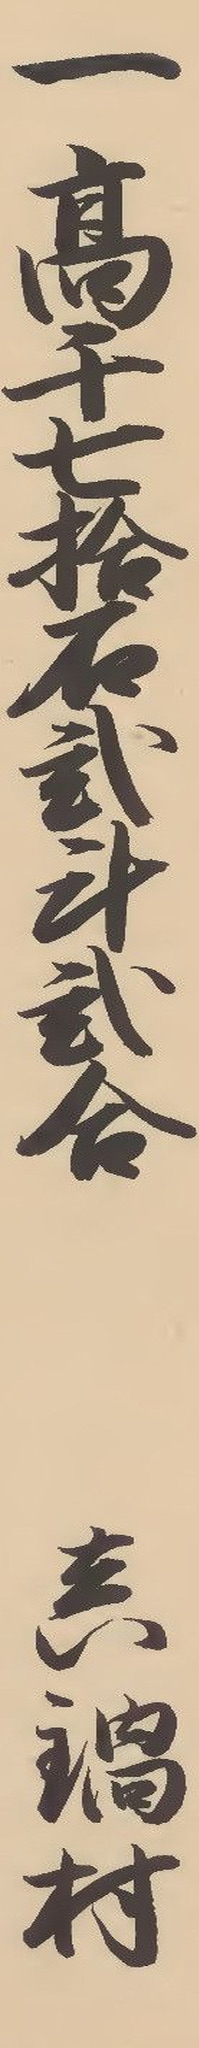一高千七拾石弐斗弐合真鍋村
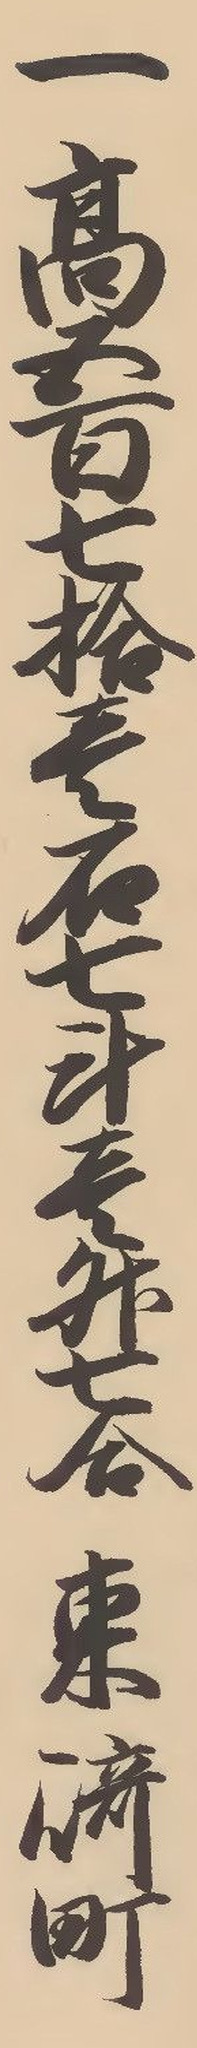一高五百七拾壱石七斗壱升七合東崎町
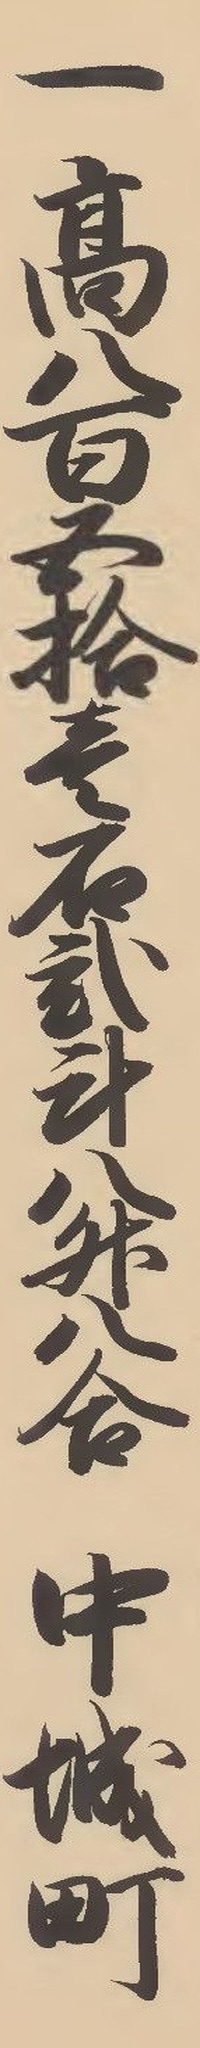一高八百五拾壱石弐斗八升八合中城町
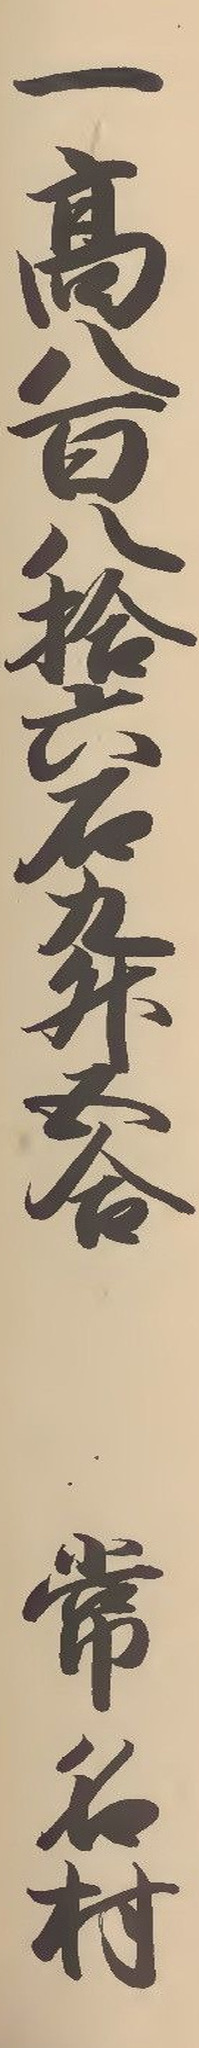一高八百八拾六石九升五合常名村
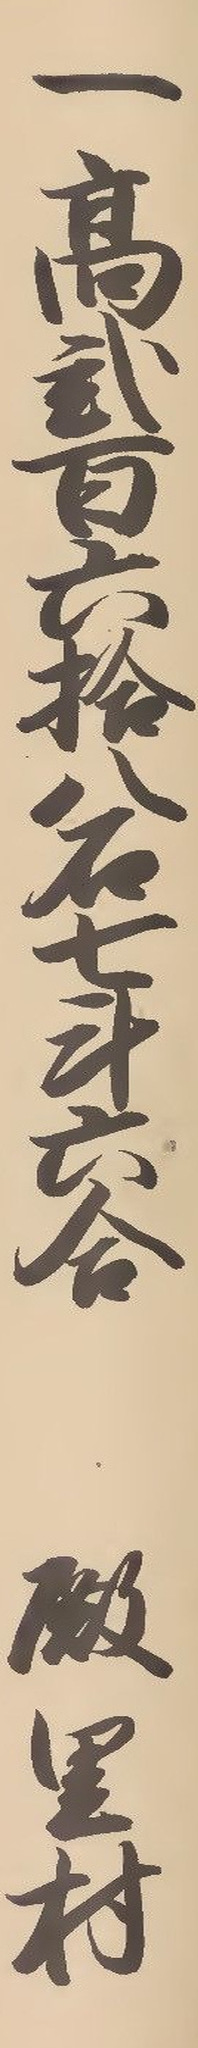一高弐百六拾八石七斗六合殿里村
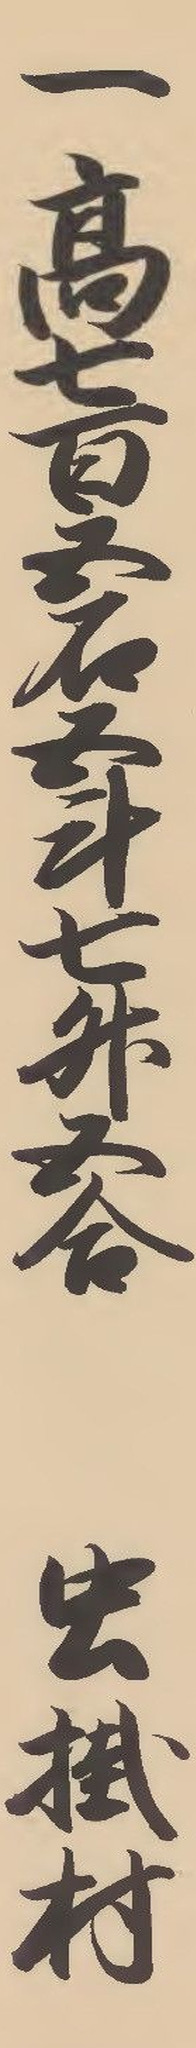一高七百五石五斗七升五合虫掛村
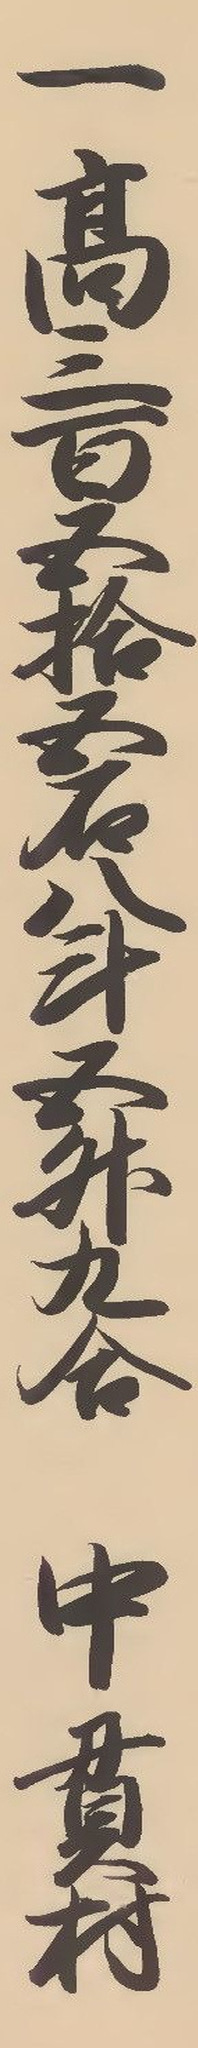一高三百五拾五石八斗五升九合中貫村
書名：常陸国郷帳
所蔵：国立公文書館 National Archives of Japan
